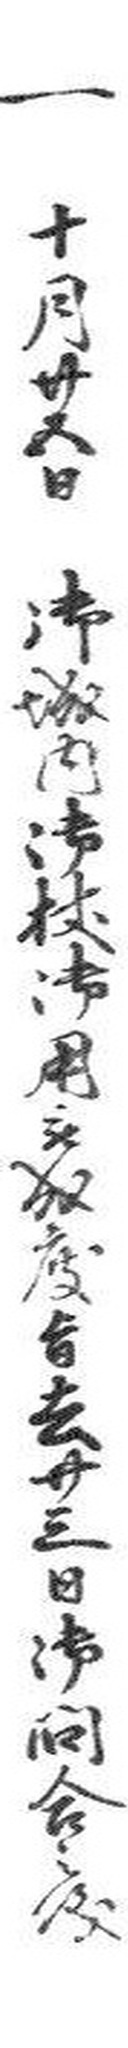一十月廿五日御城内御杖御用被成度旨去廿三日御問合之儀
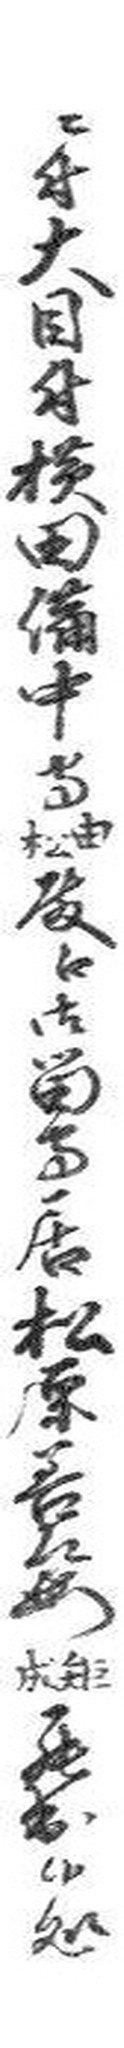ニ付大目付横田備中守由松殿江御留守居松原善左衛門矩成罷出候処
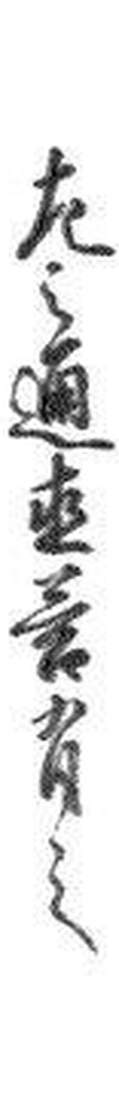左之通直答有之
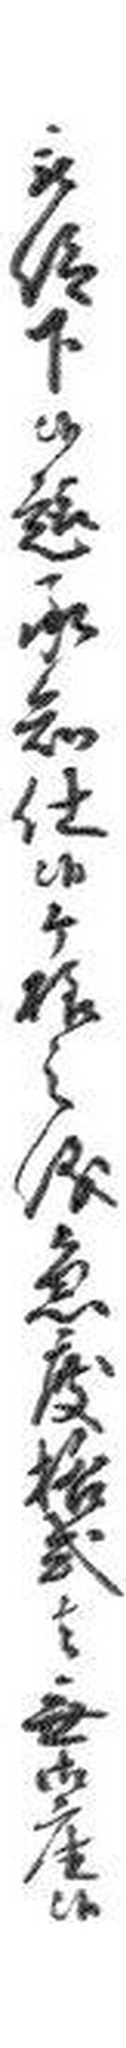被仰下候趣承知仕候ヶ様之儀急度格式者無御座候
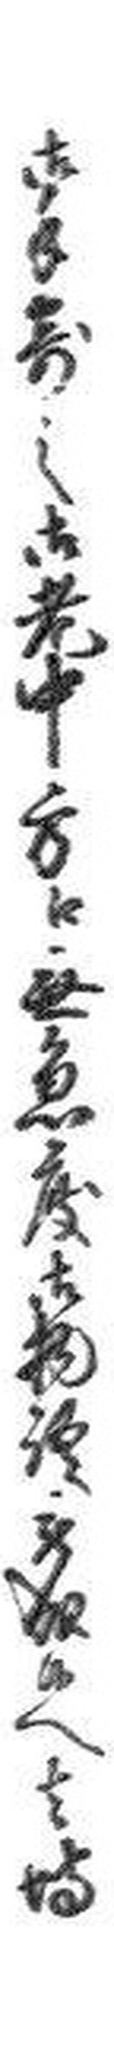御年寄之御老中方江無急度御物語被成候へ者埒
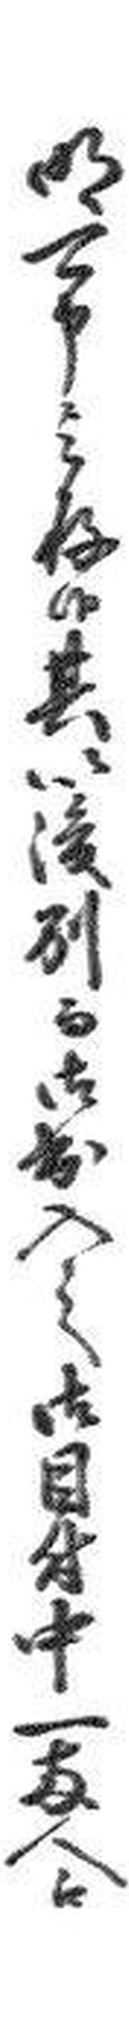明可申と存候其以後別而御出入之御目付中一両人江
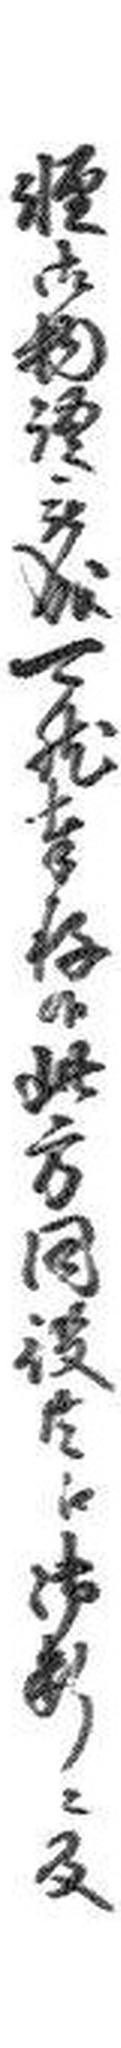軽御物語被成可然奉存候此方同役共江御断ニ及
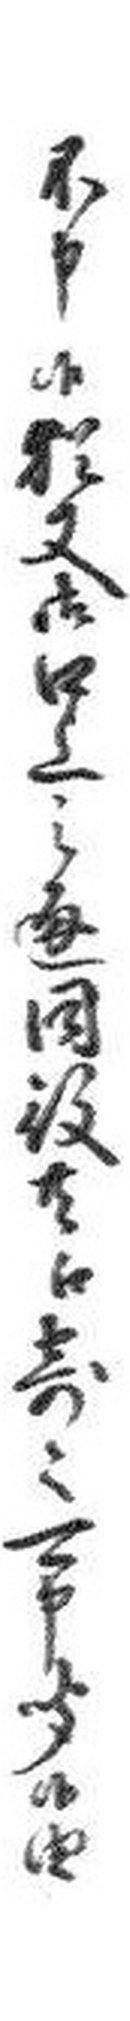不申候猶又御口上之通同役共江寄々可申聞候由
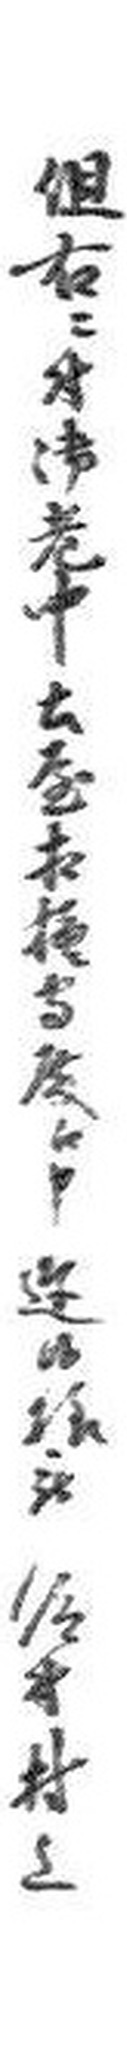但右ニ付御老中土屋相模守殿江申達候様被仰付村上
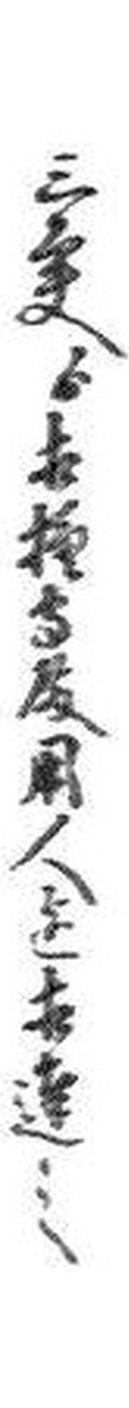三大夫ゟ相模守殿用人迄相達之
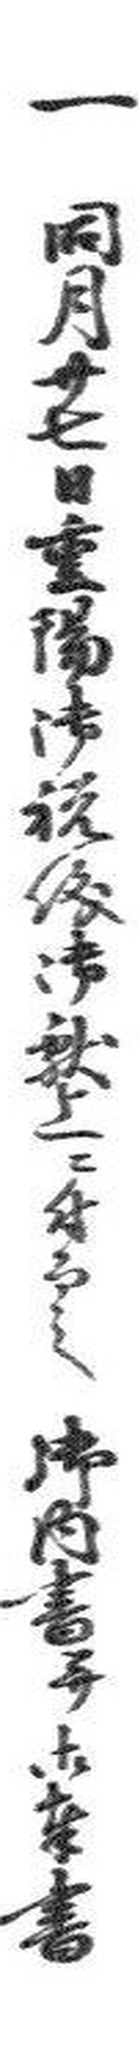一同月廿七日重陽御祝儀御献上ニ付而之御内書并御奉書
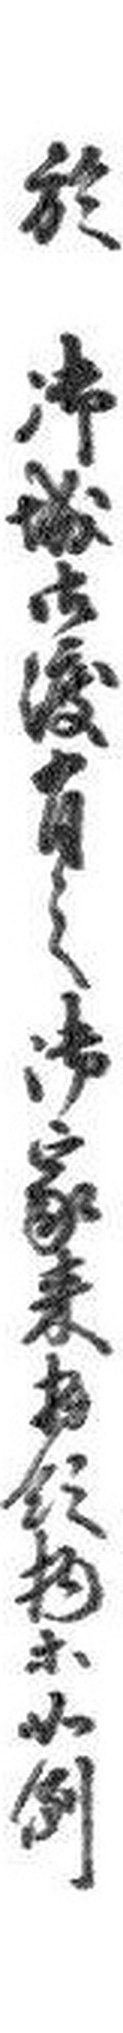於御城御渡有之御家来拝領物等如例
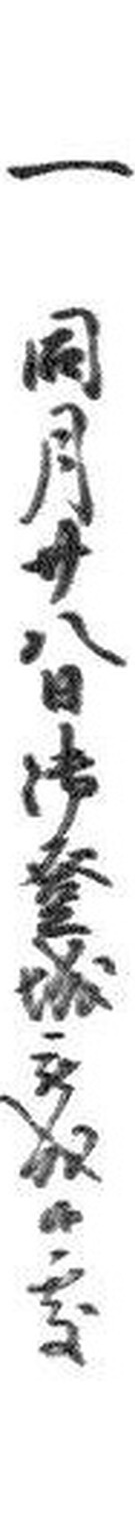一同月廿八日御登城被成候処
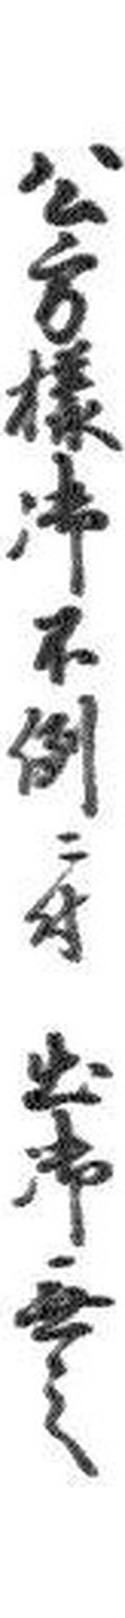公方様御不例ニ付出御無之

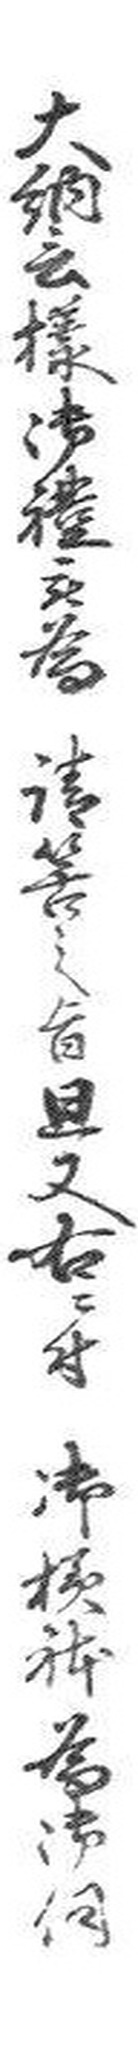大納言様御礼被為請筈之旨且又右ニ付御様体為御伺
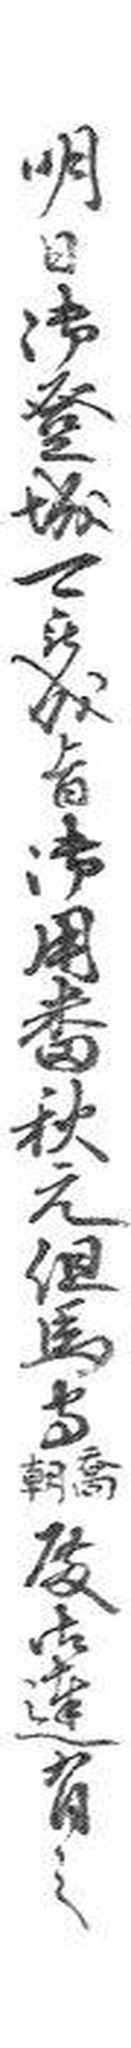明日御登城可被成旨御用番秋元但馬守喬朝殿御達有之
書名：家譜 二十四 吉品公 従宝永三年到同五年
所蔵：福井県文書館 Fukui Prefectural Archives
